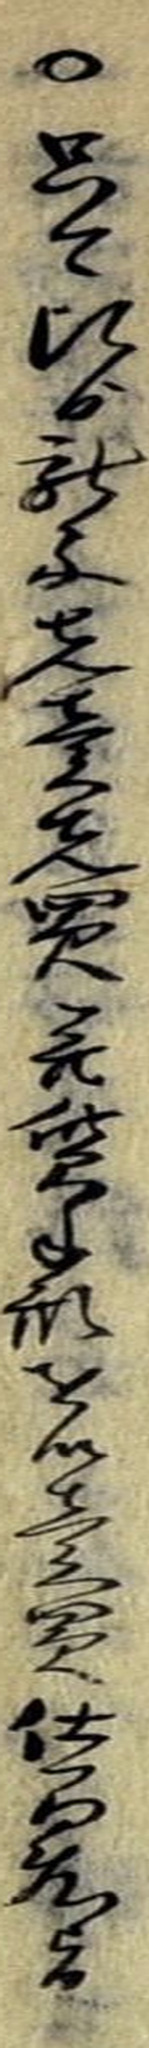○只今頃ゟ新米先売先買并質手形を以売買仕間敷旨
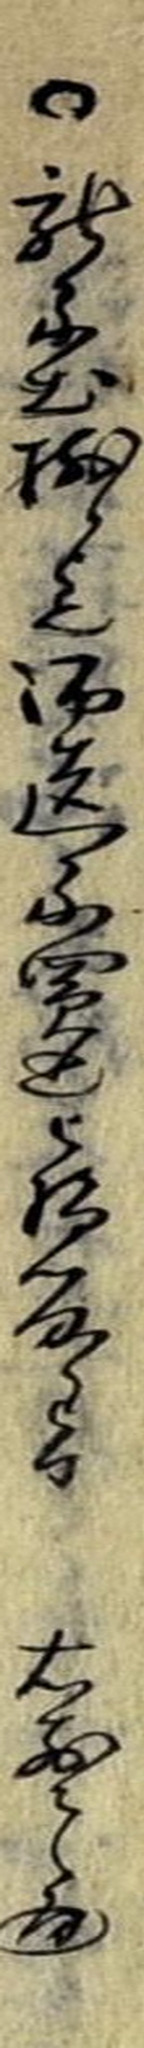○新米出揃候迄酒造米買込被指留候旨右前々之通
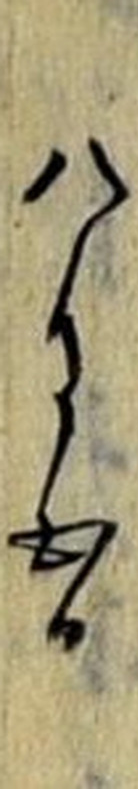九月五日
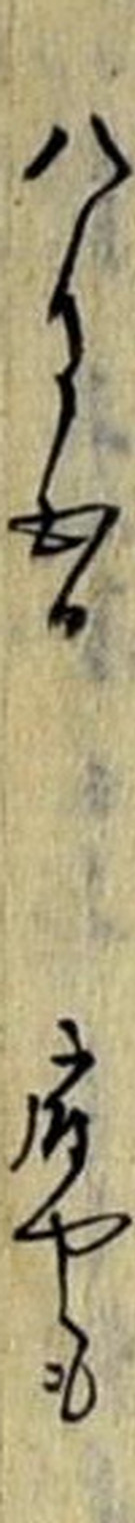八月五日府中へも
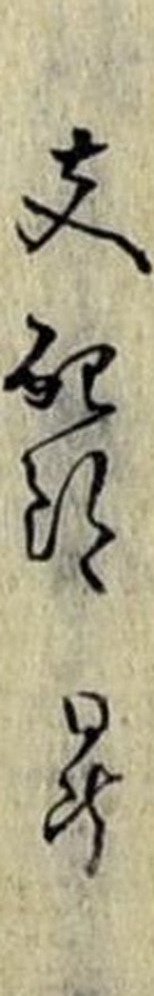支配頭へ同断
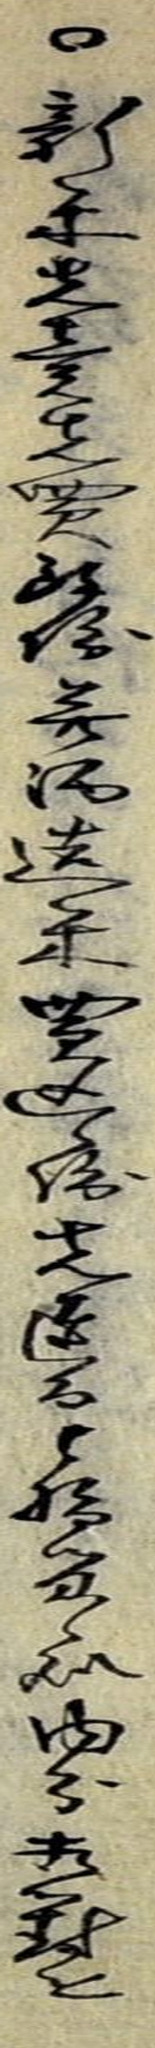○新米先売先買致儀并酒造米買込之儀先達而被指留候処内分相対を
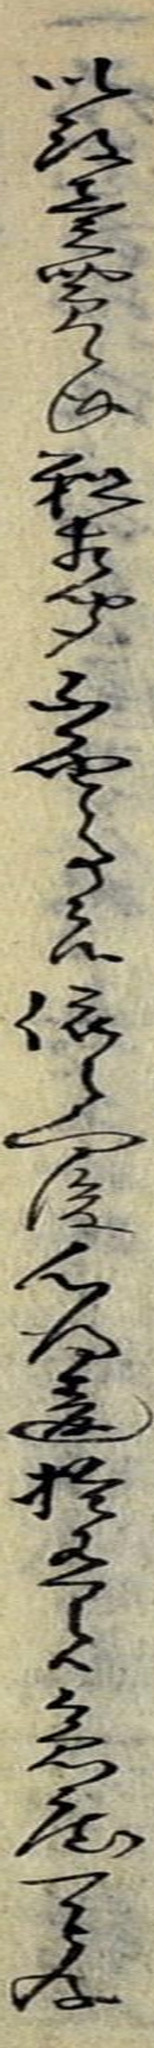以致売買候趣粗相聞不届之事ニ候依之向後心得違於有之ハ急度可被及
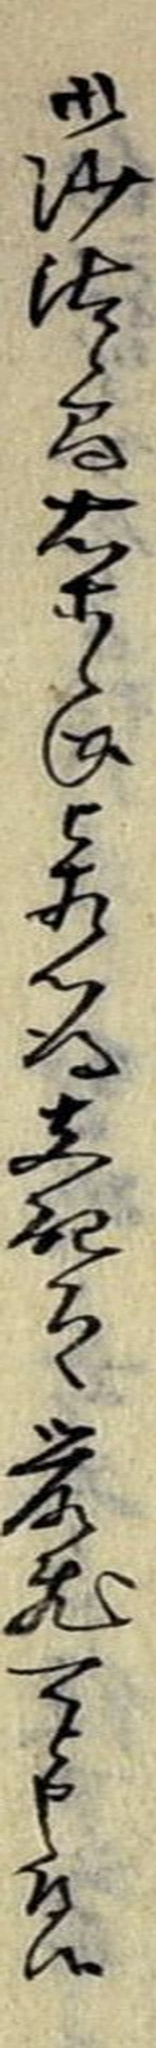御沙汰候間右等之趣被相心得支配下へ厳敷可被申付候
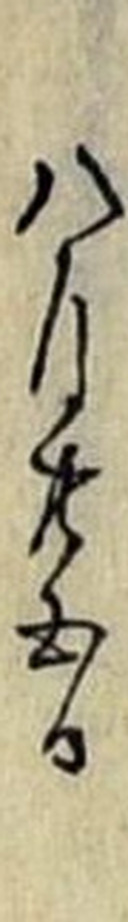七月廿五日
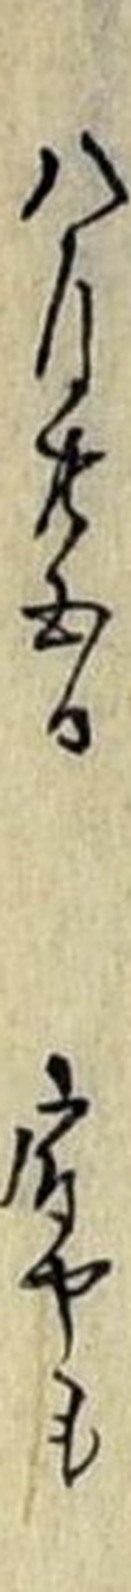八月廿五日府中へも
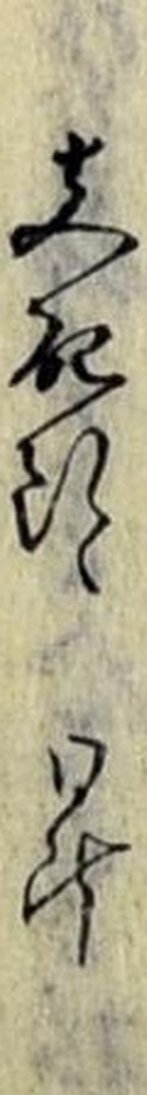支配頭へ同断
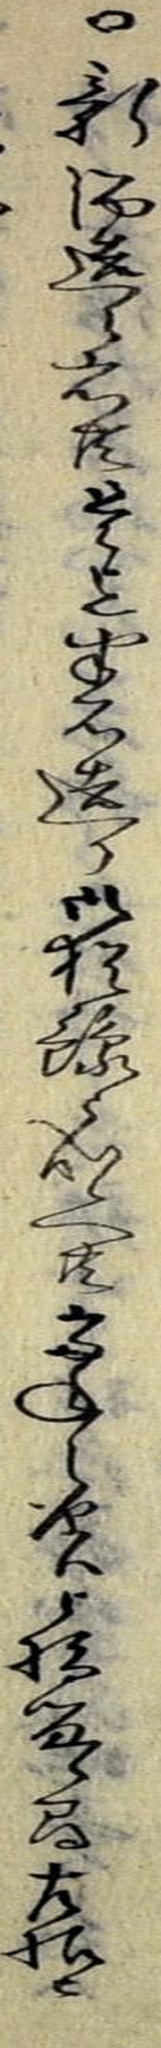○新酒造之者共是迄半石造り御猶予被成候へ共当年之儀ハ被指留候間左様被
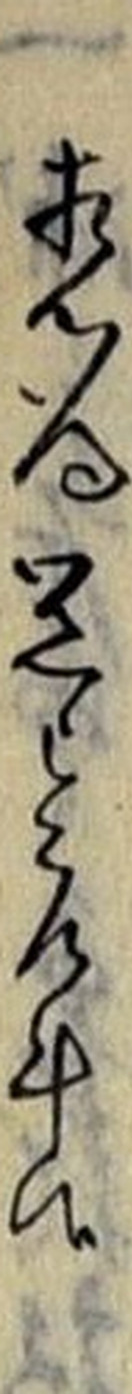相心得宜被取計候
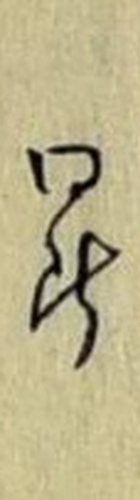同日同断
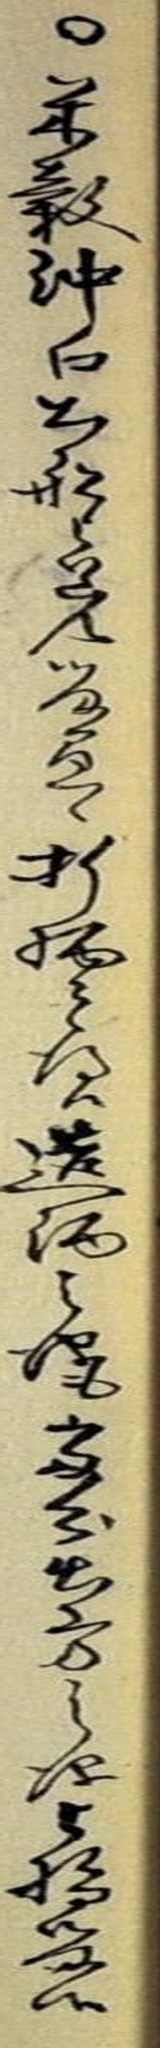○米穀沖ノ口出船被差留置候折柄ニ候得ハ造酒之儀も当分出方之儀被指留候
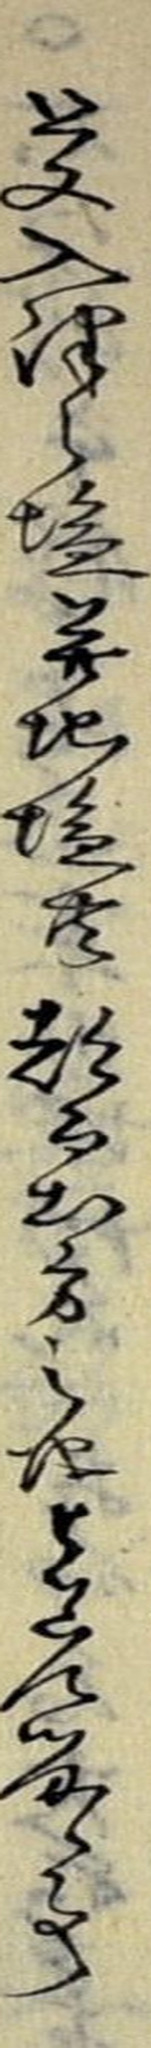且又入津之塩并地塩共都而出方之儀被差留候事
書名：命令之部 五
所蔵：福井県文書館 Fukui Prefectural Archives
